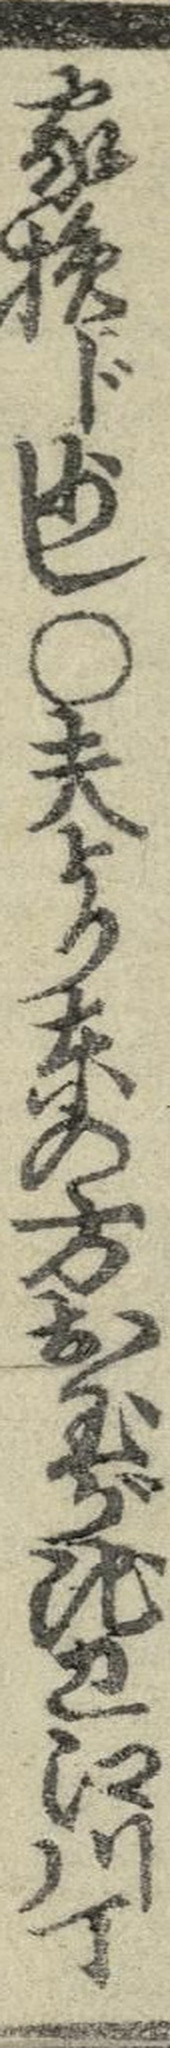家損じ少し〇夫より東の方於玉が池辺江川丁
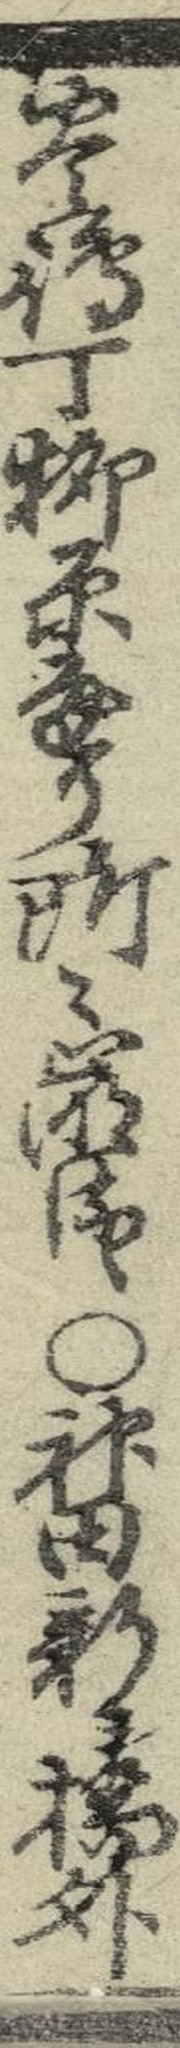豊嶋丁柳原通り所〻崩るゝ〇神田新シ橋外
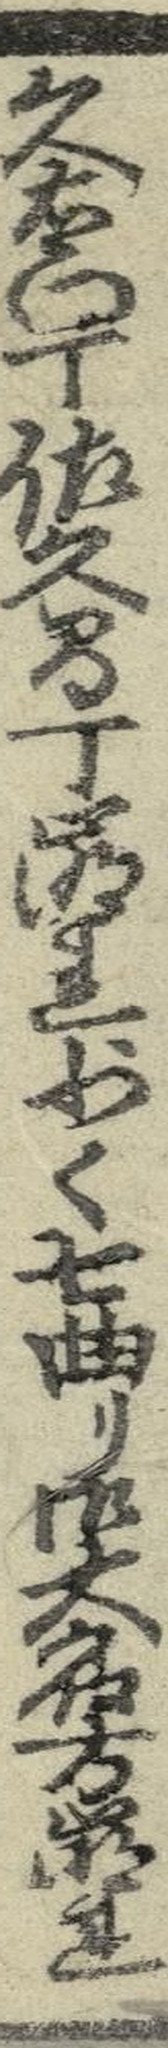久右衛門丁佐久間丁崩れ少く七曲り御大名方崩れ
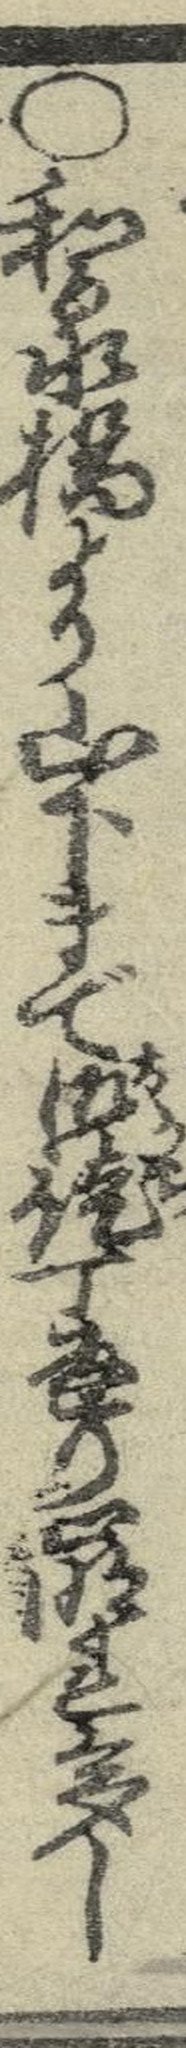〇和泉橋より山下まで御徒丁通り崩れ多し
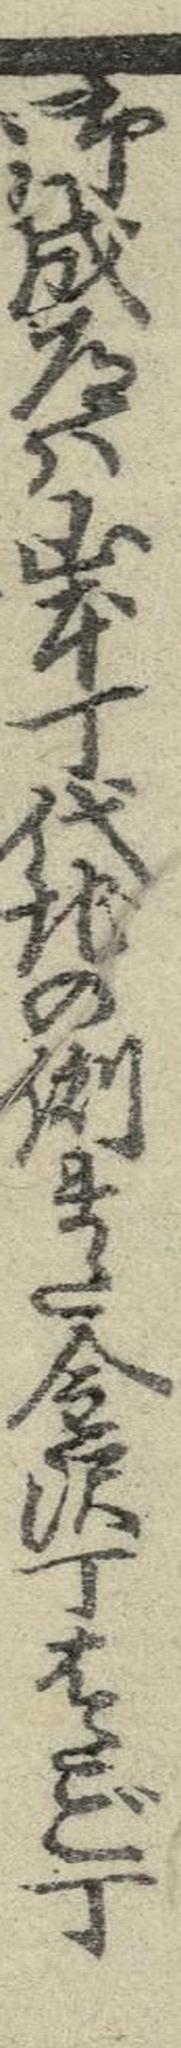御成道ハ山本丁代地の側また金沢丁はたご丁
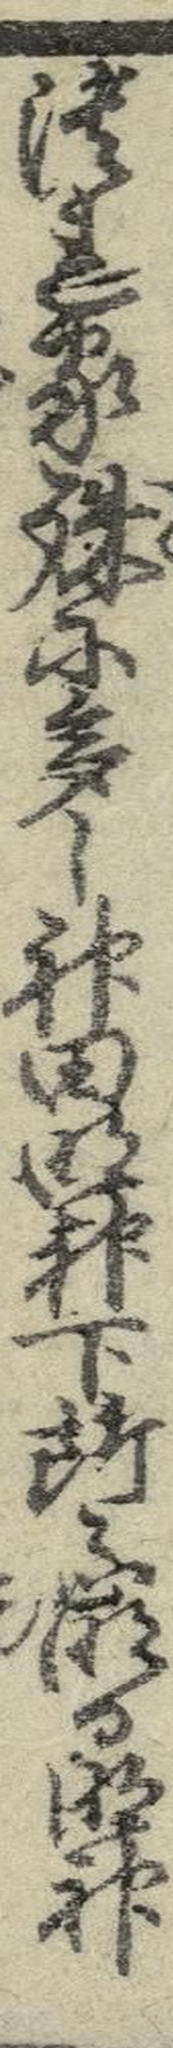潰れ家殊に多し神田明神下所〻崩る明神
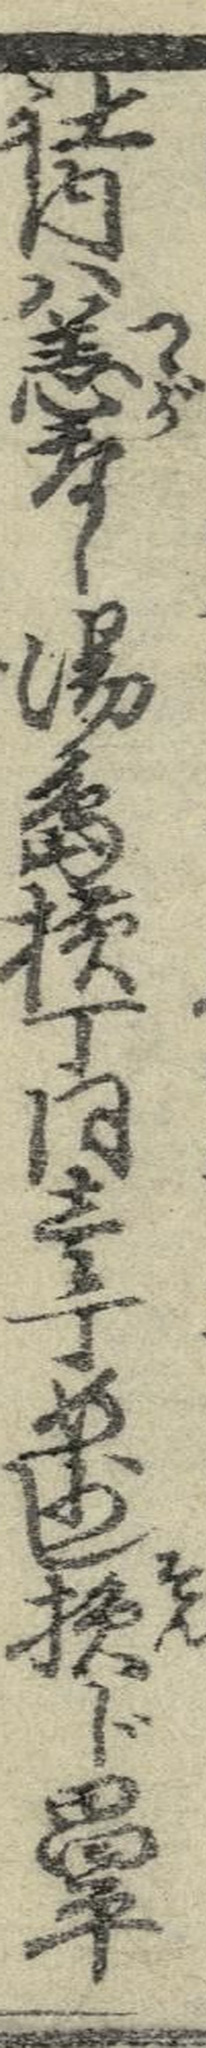社内ハ恙なし湯島横丁同壱丁め少し損じ昌平
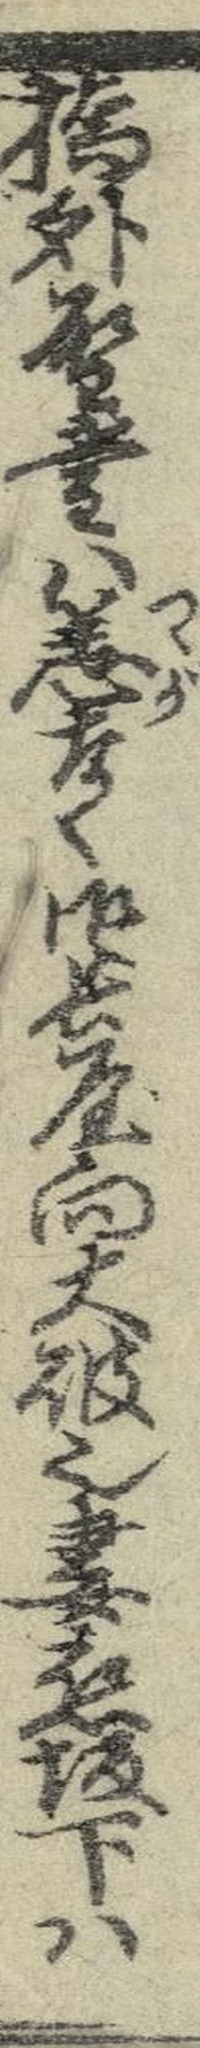橋外聖堂ハ恙なく御長屋向大破也妻恋坂下ハ
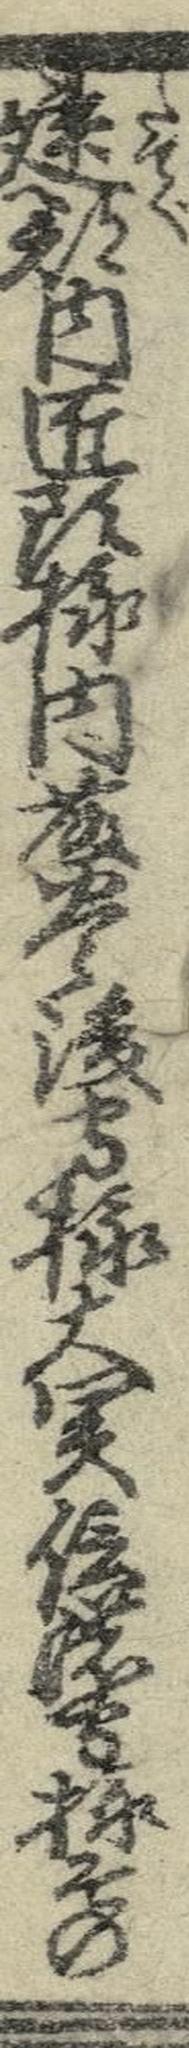建部内匠頭様内藤豊後様大関信濃守様その
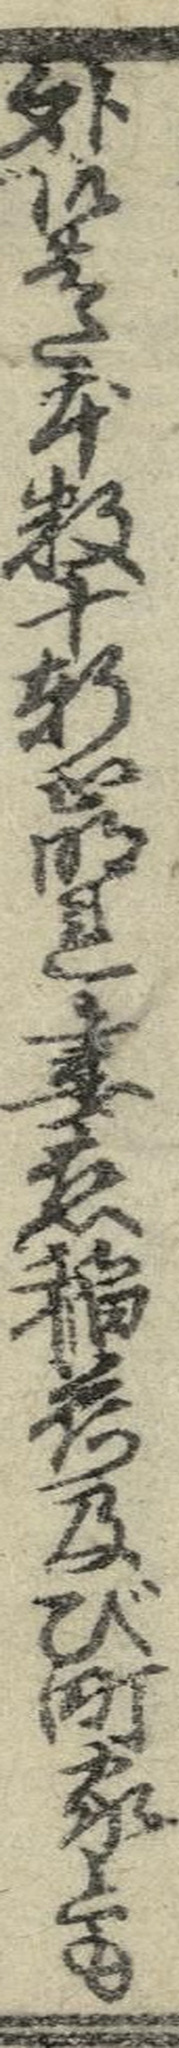外御はた本数十軒崩れ妻恋稲荷及び町家とも
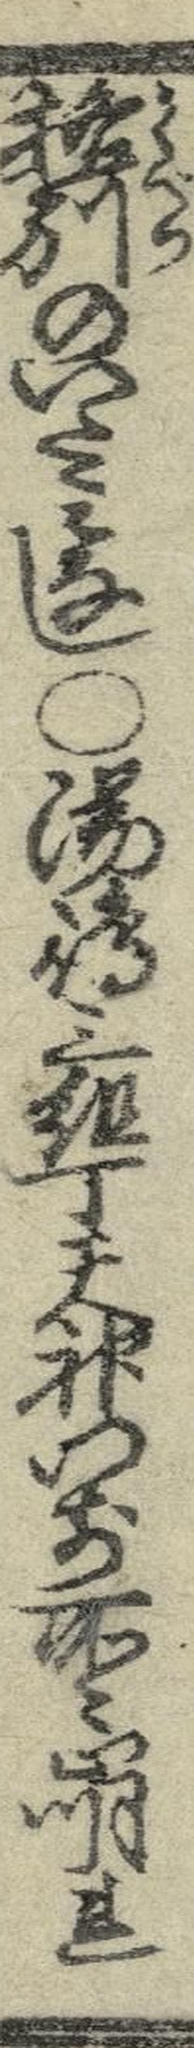格別のいたみなし〇湯嶋三組丁天神門前所〻崩れ
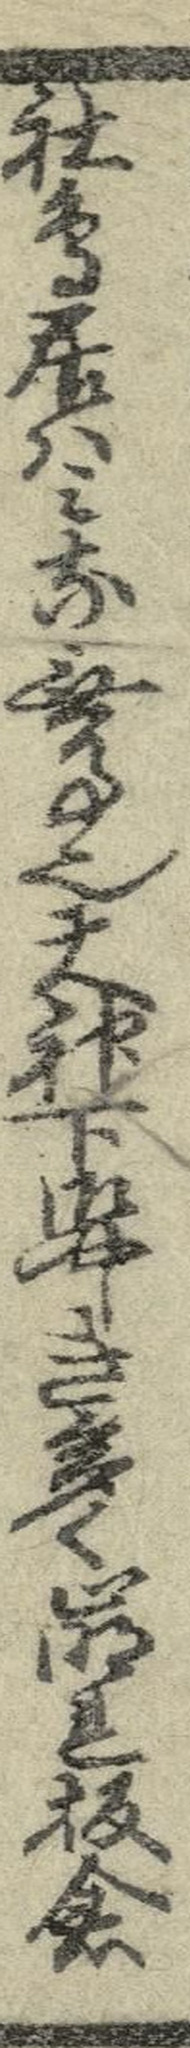社鳥居ハみな無事也天神下御やしき多く崩れ板倉
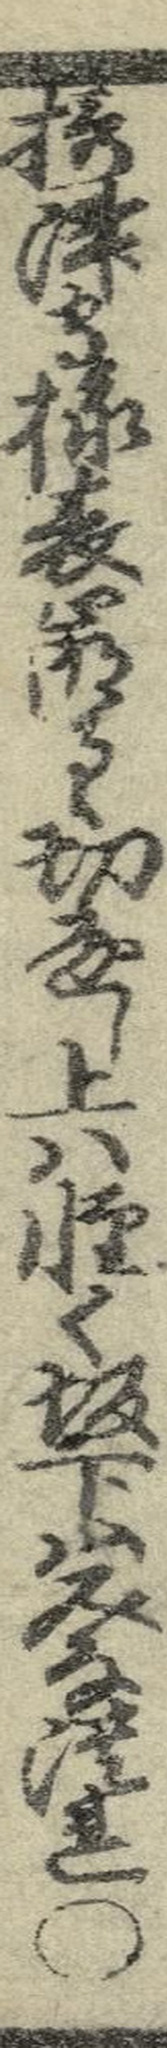摂津守様表崩るゝ切通し上は軽く坂下ハみな潰れ〇
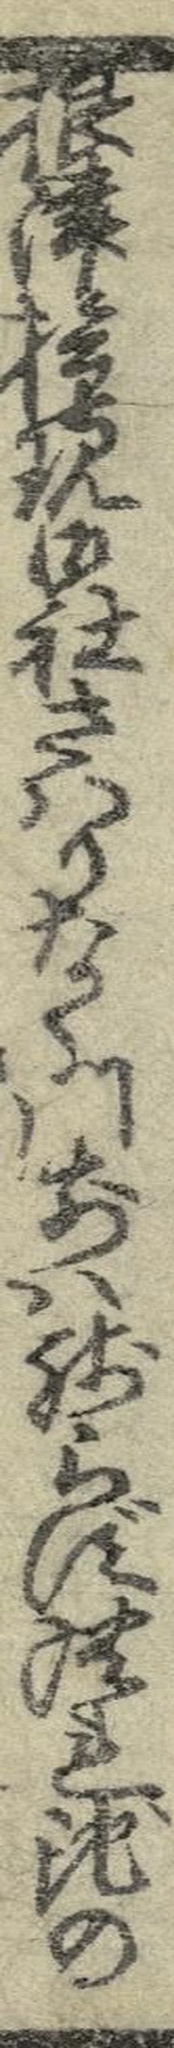根津権現御社さハりなく門前ハ残らず潰れ池の
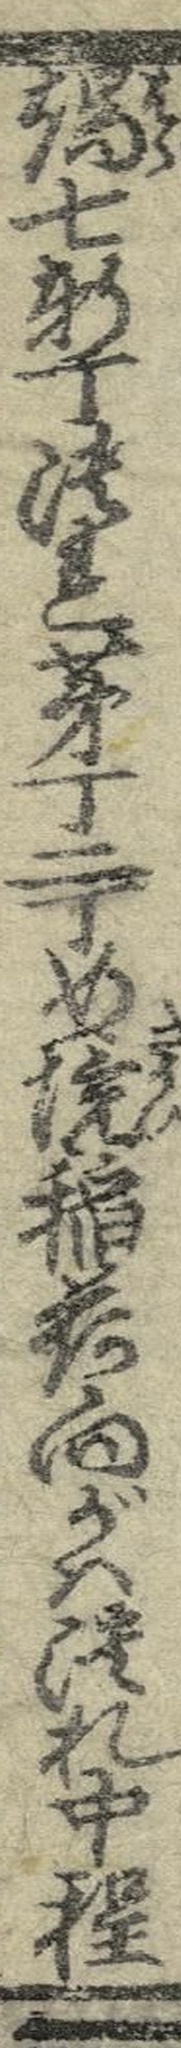端七軒丁潰れ茅丁二丁め境稲荷向がハ潰れ中程

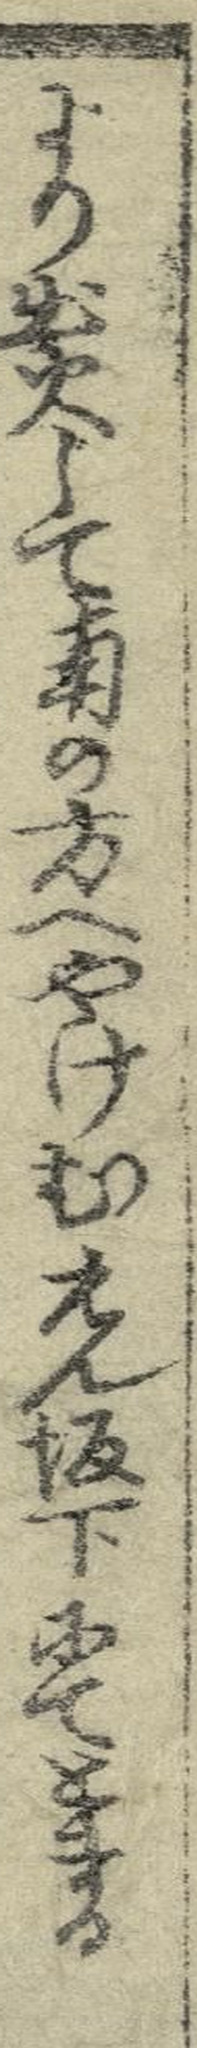より出火して南の方へやけむえん坂下にてとまる
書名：地震並出火細見記
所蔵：東京大学地震研究所図書室 Earthquake Research Institute Library, The University of Tokyo, JAPAN
